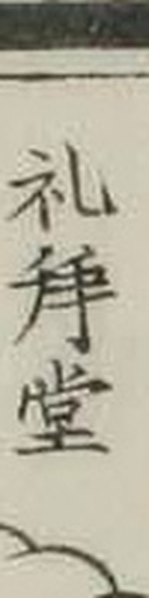礼拝堂
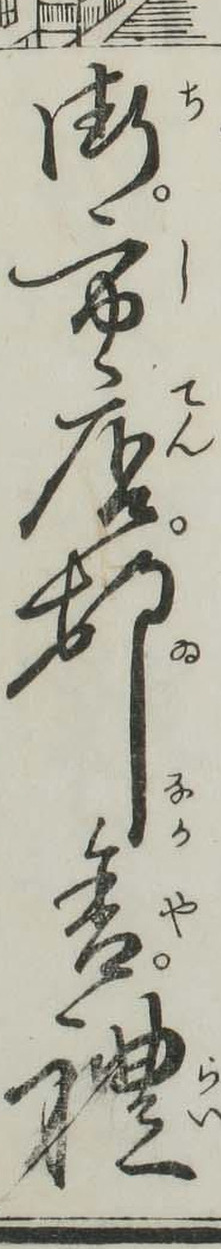街。市店。邨舎。礼

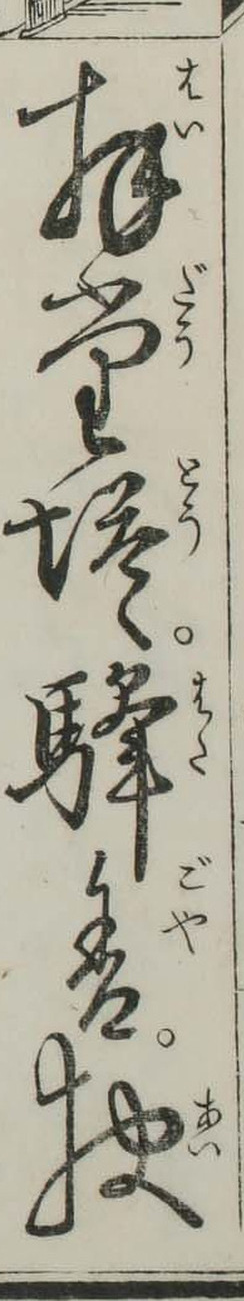拝堂塔。駅舎。報
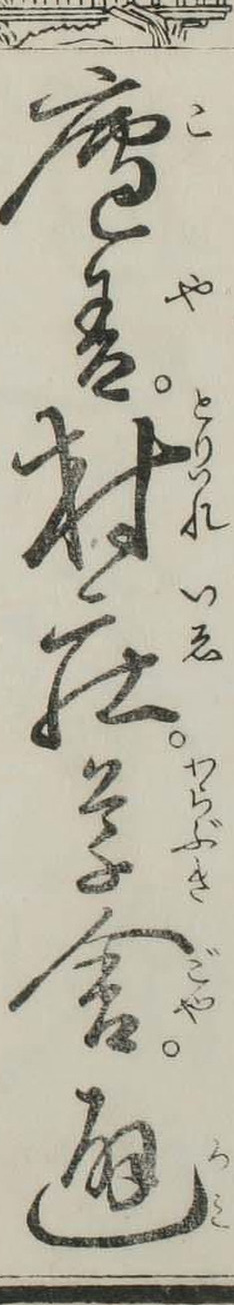蘆舎。村庄。草舎。避
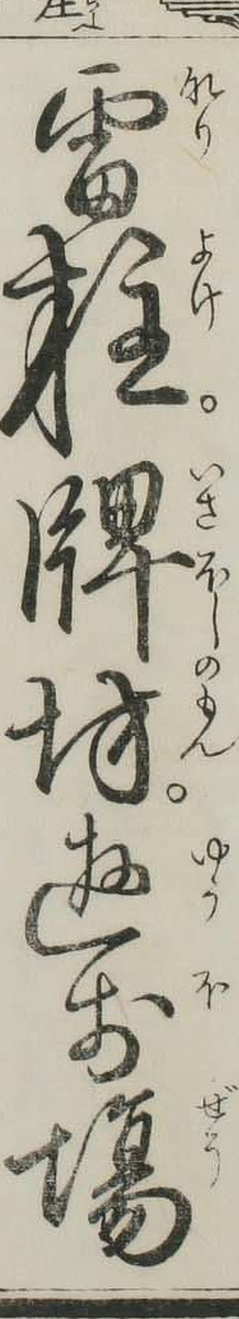雷柱。牌坊。遊歩場
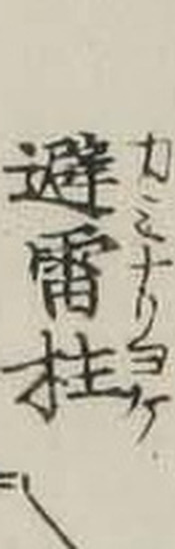避雷柱
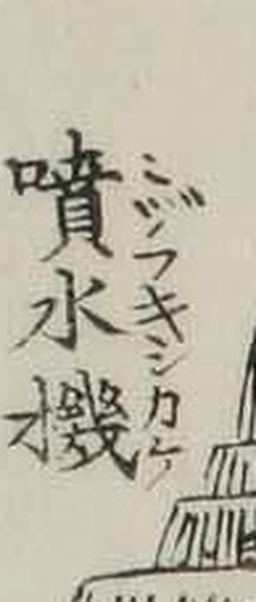噴水機
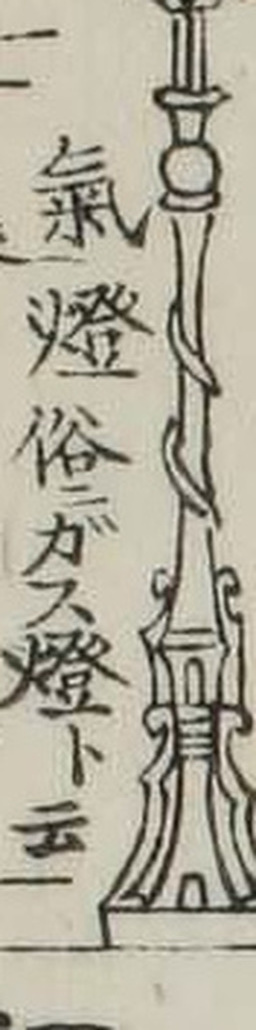気燈俗ニガス燈ト云
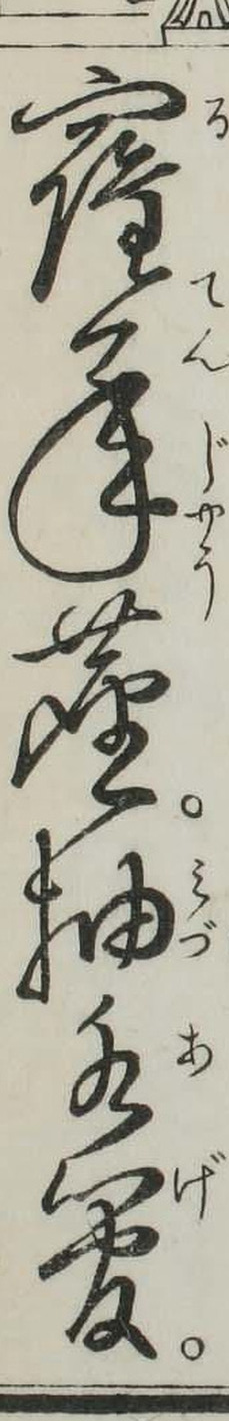窿承塵。抽水管。

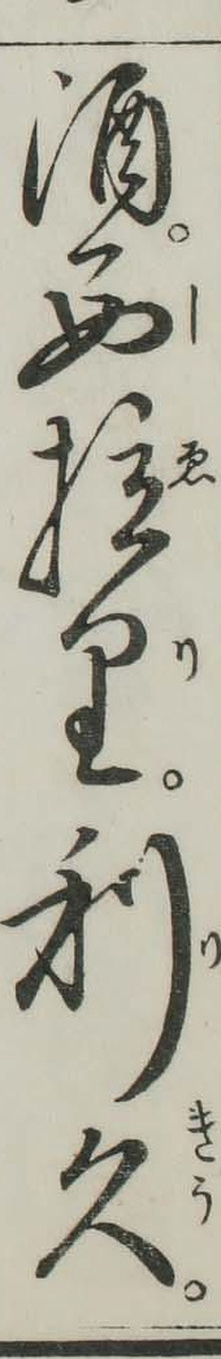酒。西遊里。利休。
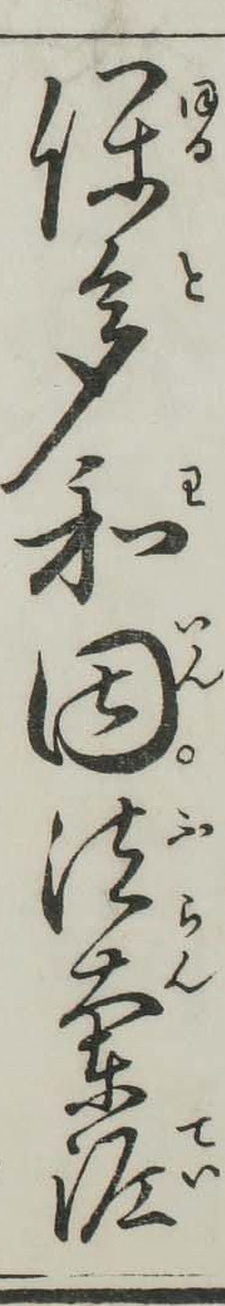保多和因。法蘭泥
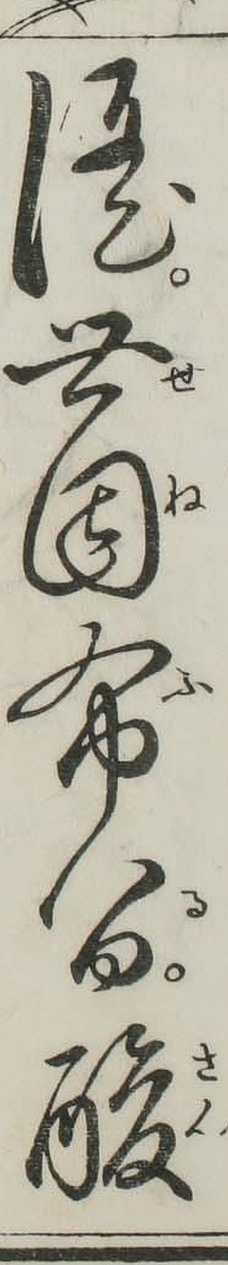酒。世因布留。酸
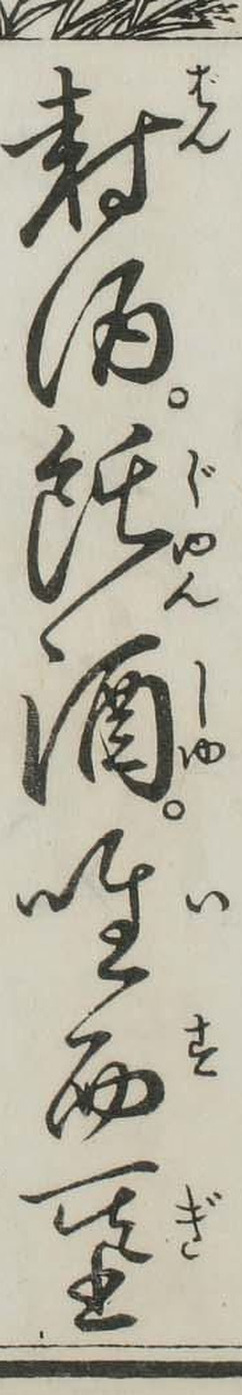封酒。純酒。唯西基
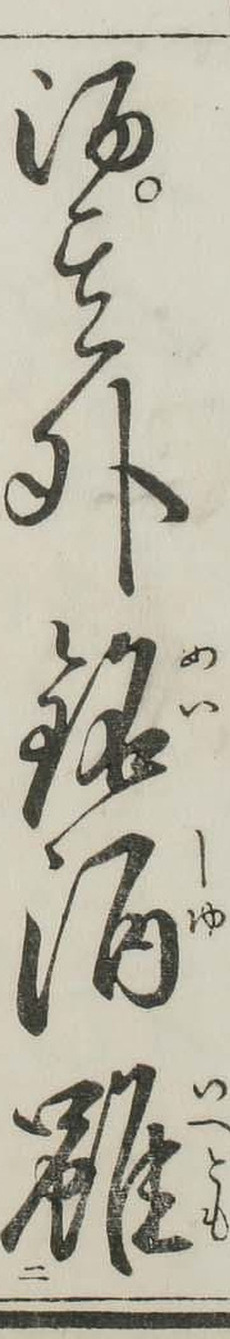酒。其外銘酒雖
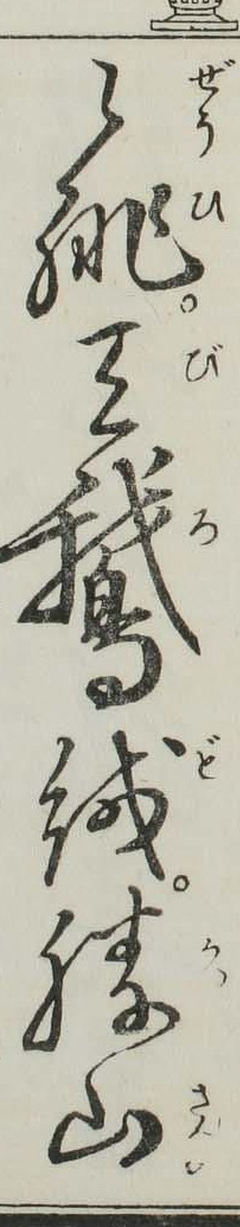々緋。天鵞絨。勝山。

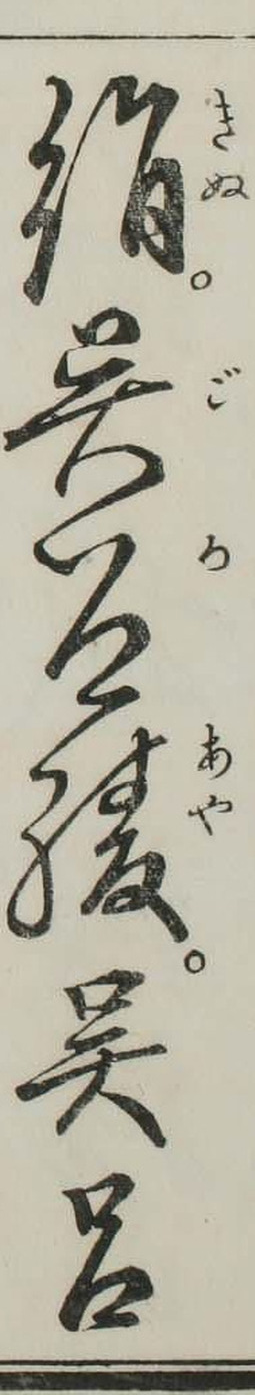絹。呉呂綾。呉呂
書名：開化往来
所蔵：東京学芸大学教育コンテンツアーカイブ
